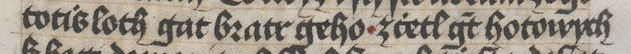totiṡ loth gat bratr geho.zċetl ḡt hotowych
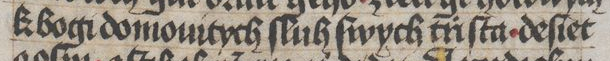k bogi domouitych ſluh ſwych tṙi ſta.deſiet
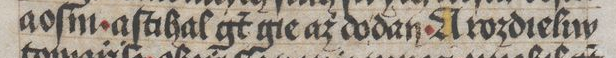a oſm.a ſtihal ḡt gie aż dodan.A rozdieliw
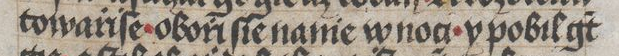towaṙiẛe.oboṙi ſie nanie wnoci.y pobil ḡt
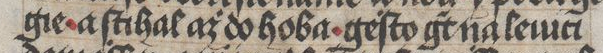gie.a ſtihal aż do hoba.geẛto ḡt na leuici
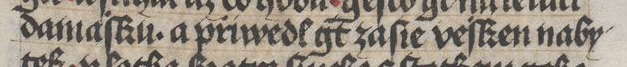damaſku.a pṙiwedl ḡt za ſie veẛken naby¬
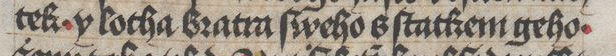tek.y lotha bratra ſweho sſtatkem geho.
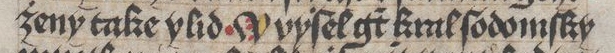żeny take ylid.Y vyẛel ḡt kral ſodomſky
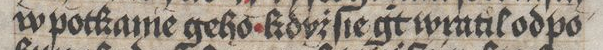w potkaníe geho.kdyż ſie ḡt wratil od po¬
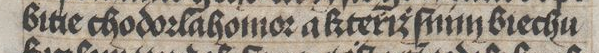bitie chodorlahomor a kteṙiż ſnim bíechu
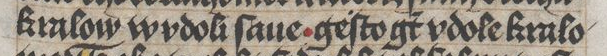kralow w ydoli ſaue.geẛto ḡt ydole kralo¬
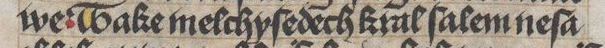we.Take melchyſedech kral ſalem neſa¬
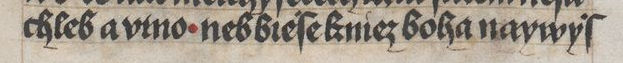chleb a vino.neb bíeẛe kniez boha naywyẛ¬
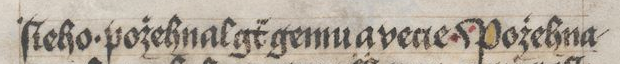ẛieho.požehnal ḡt gemu a vecie.Pożehna¬
